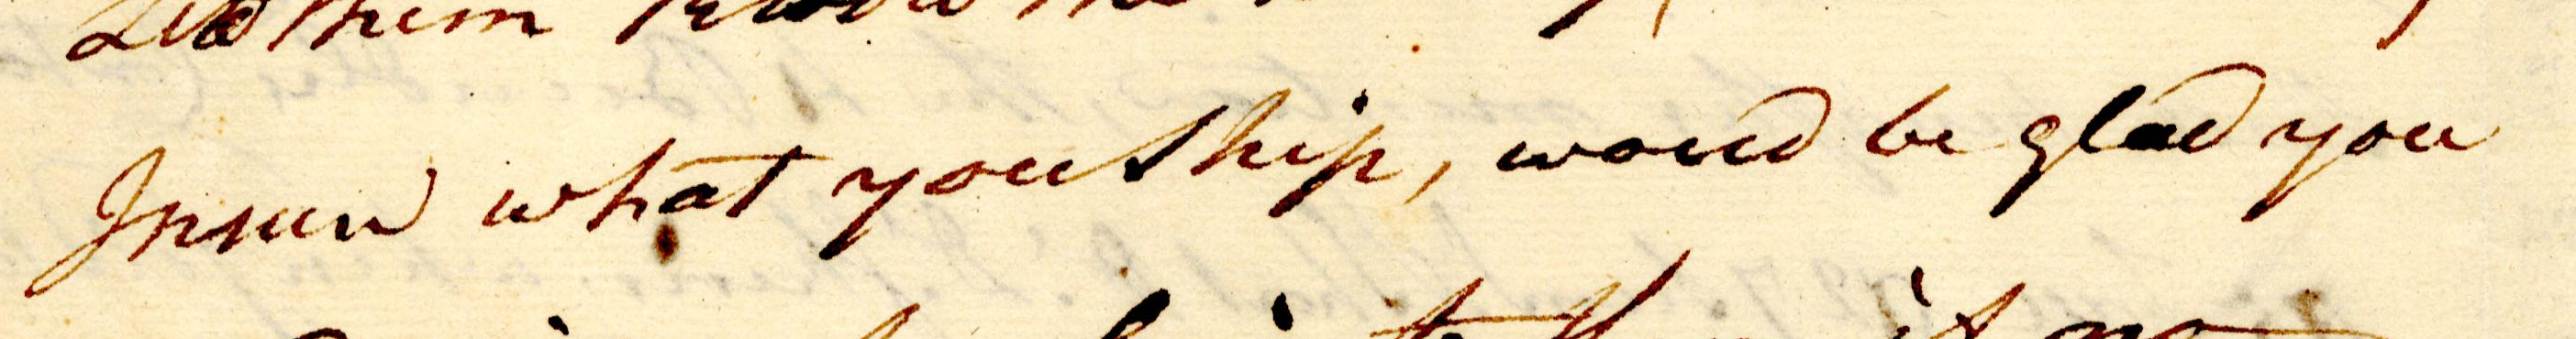Insure what you ship, would be glad you
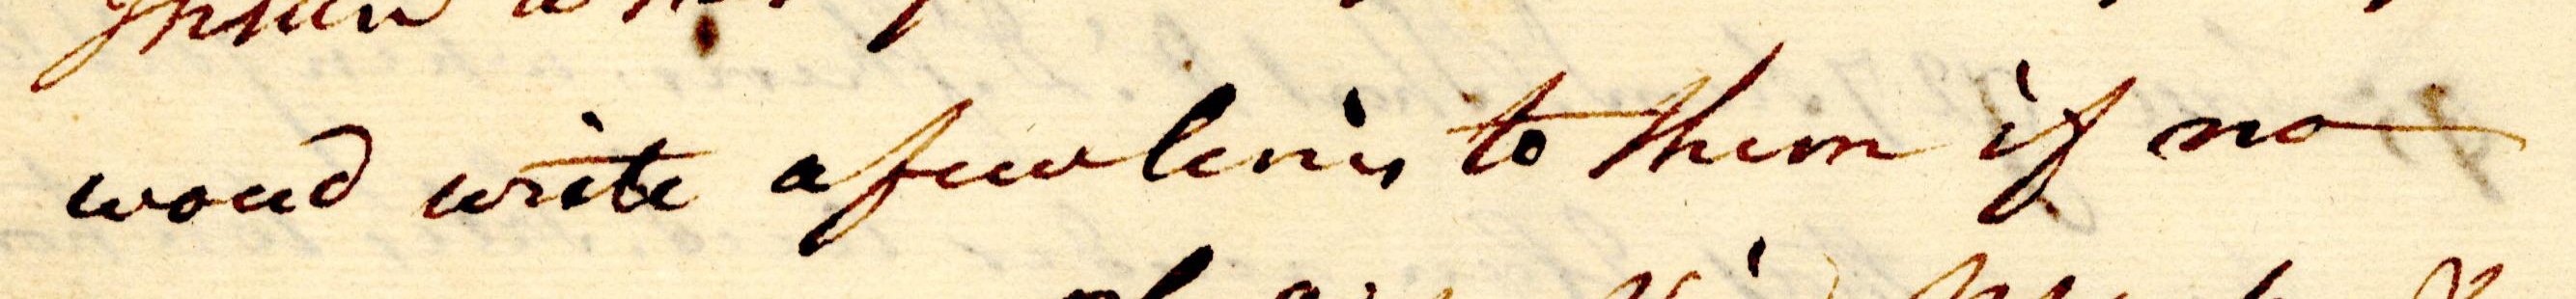woud write a few lines to them if no
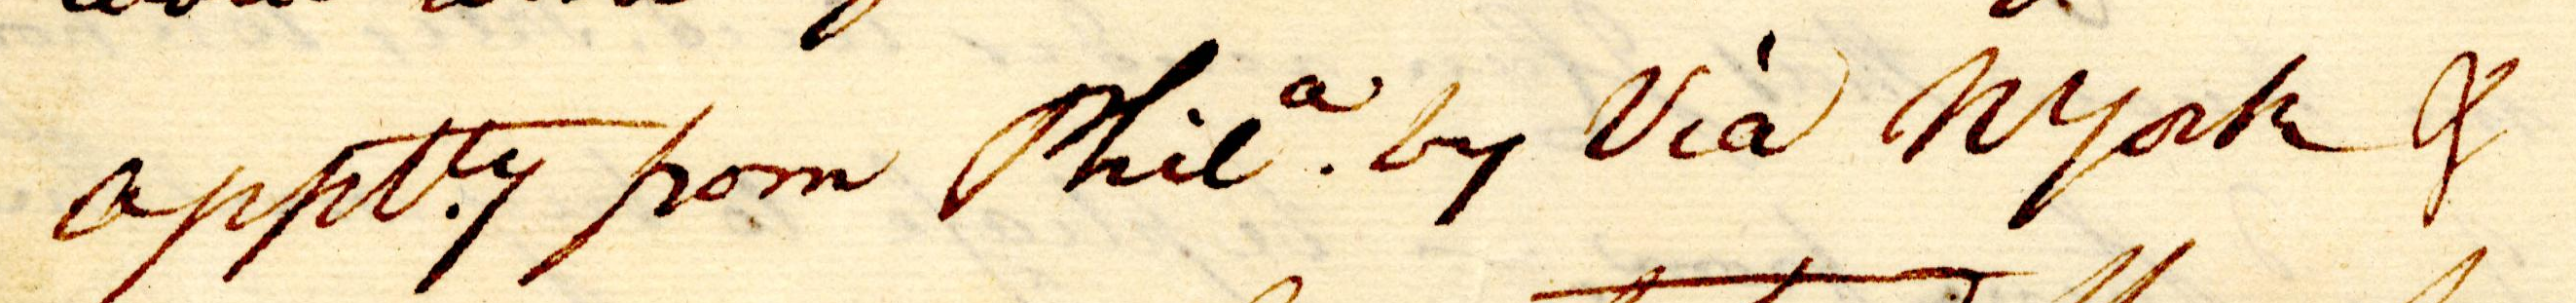opp^tty from Phil^a. by Via NYork &
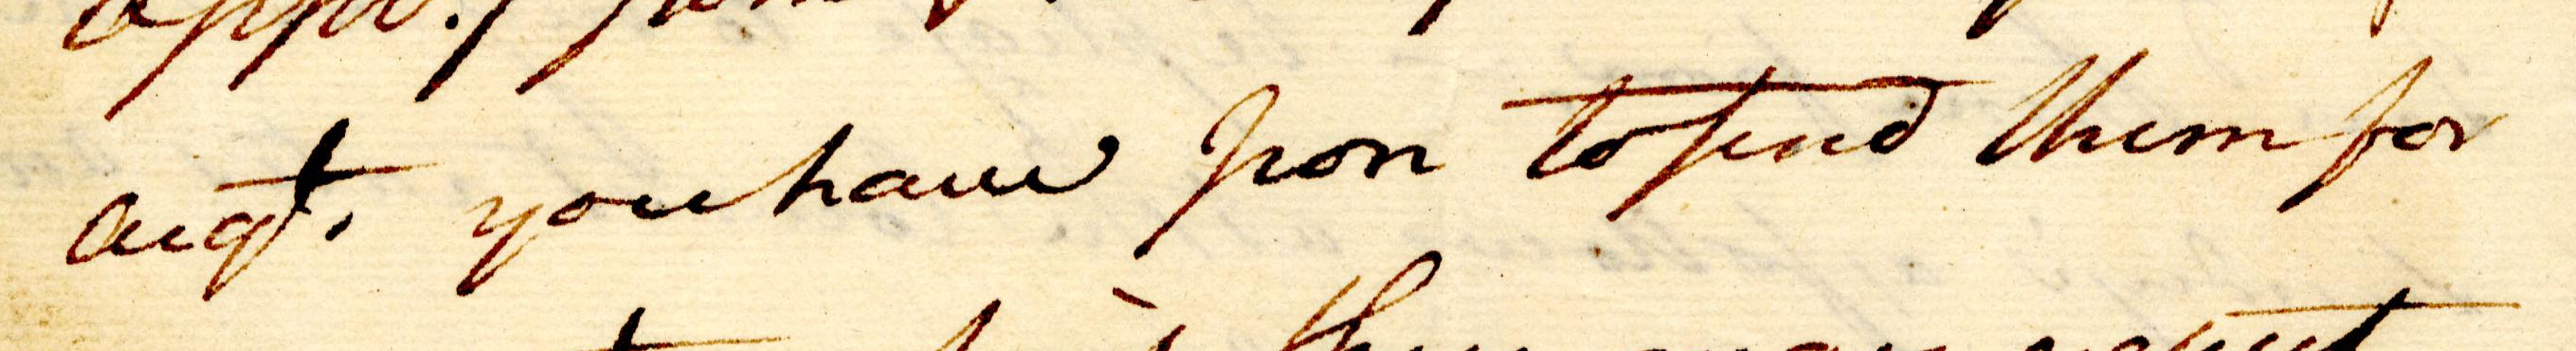acq^t. you have Iron to send them for
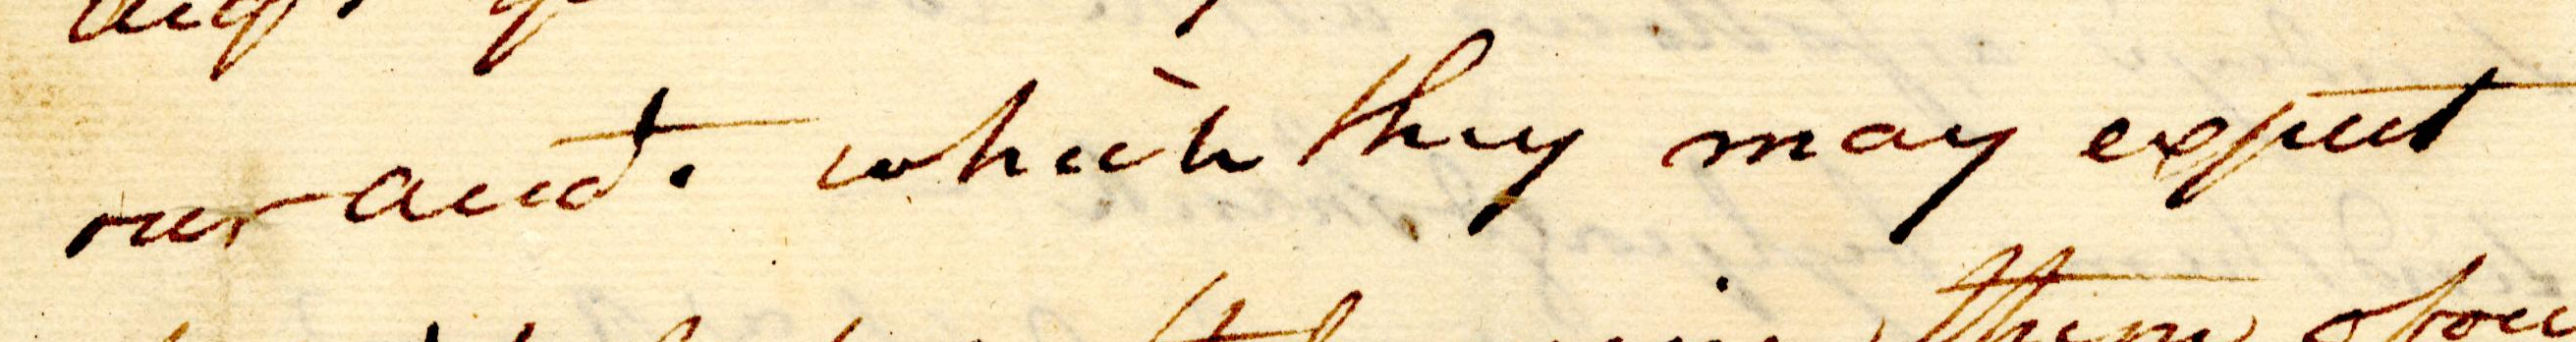our acco^t. which they may expect
